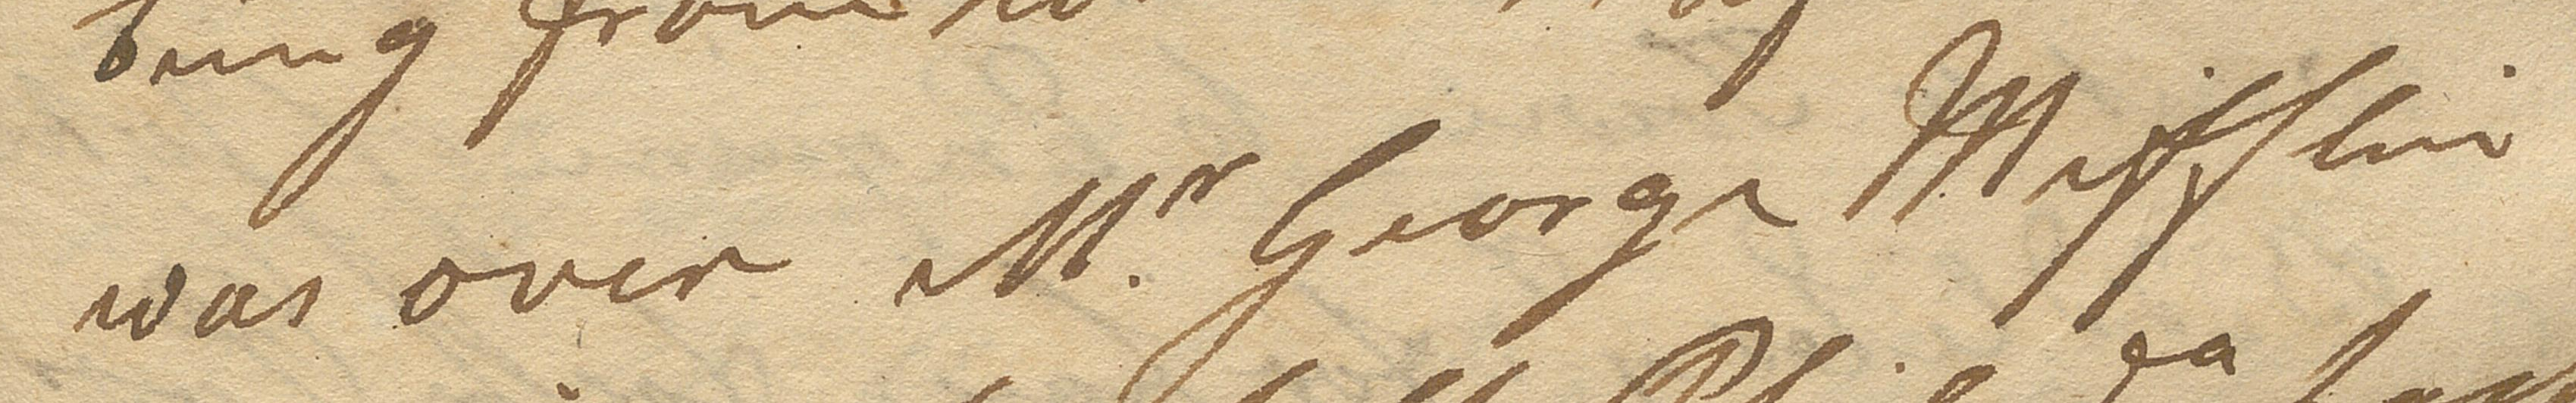was over M^r. George Mifflin
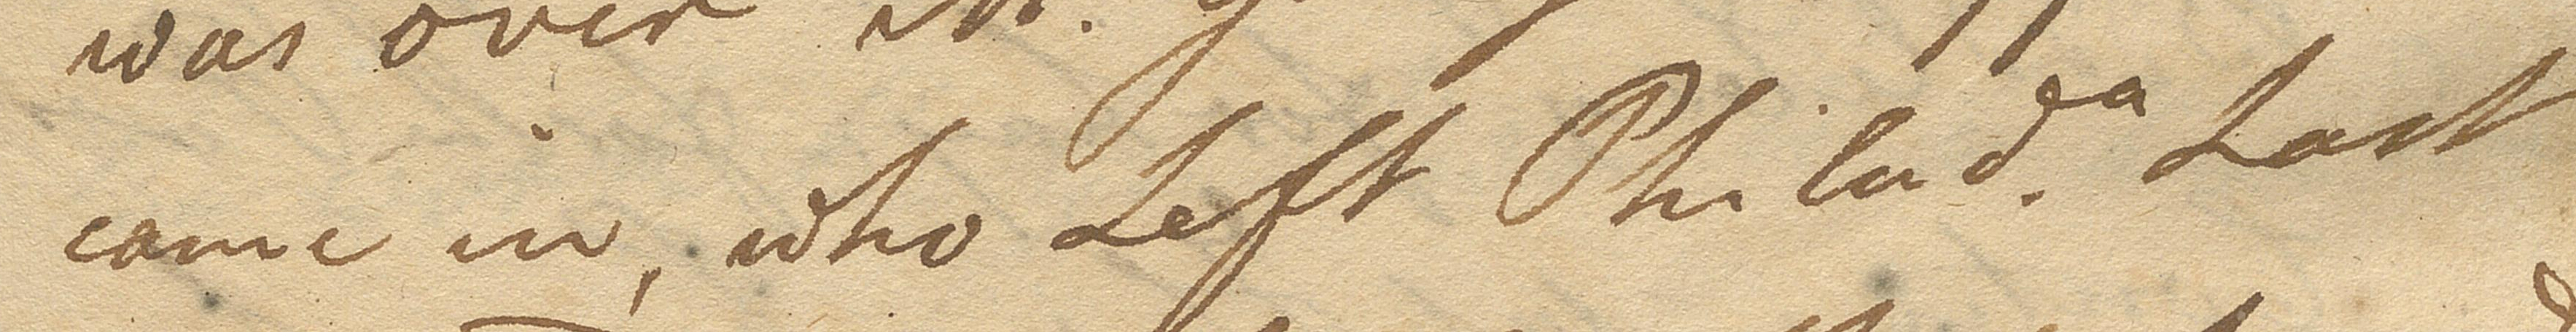came in, who Left Philad^a. Last
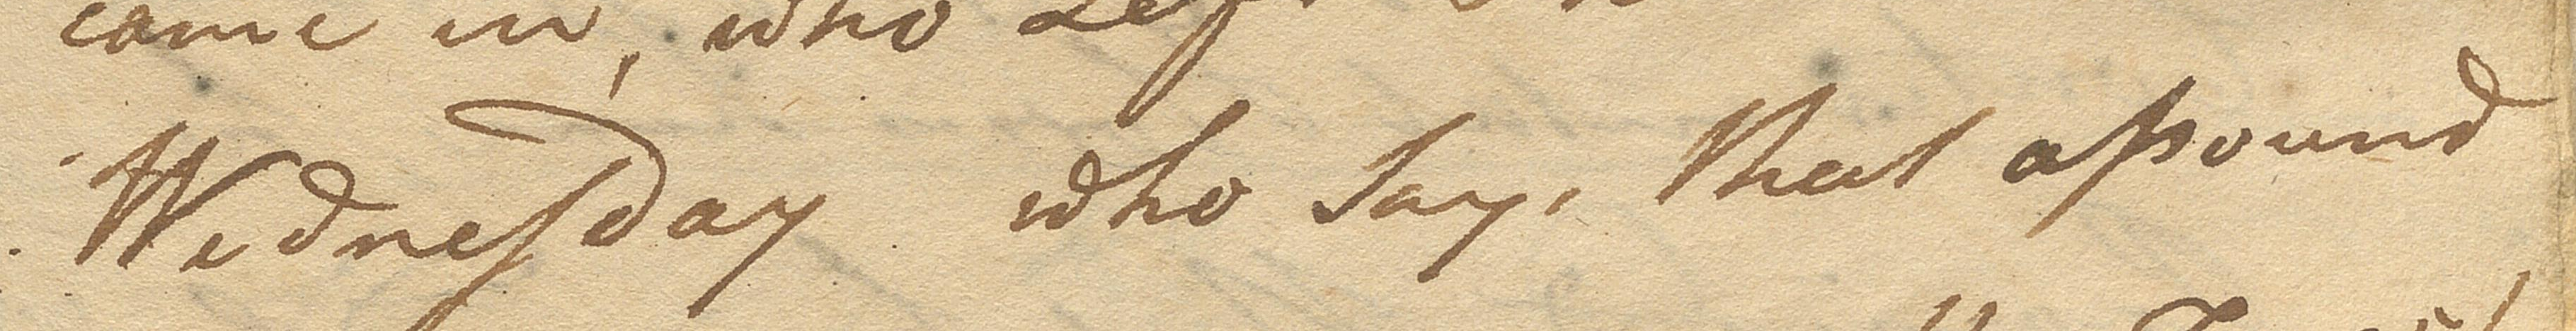Wednesday who says that a pound
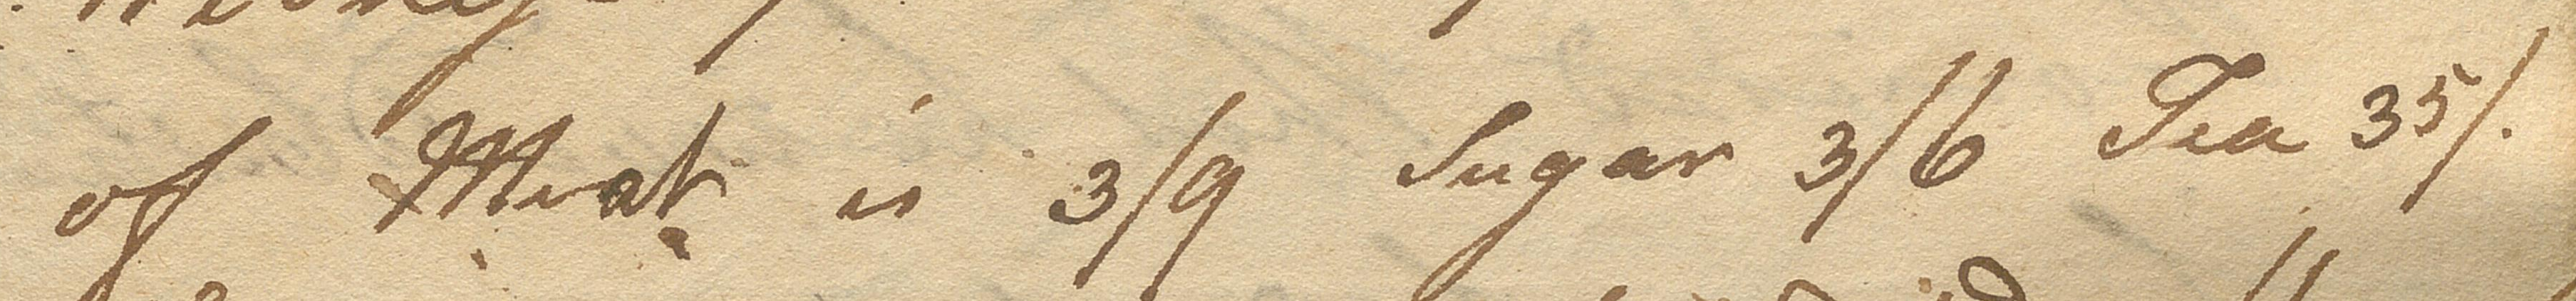of Meat is 3s9 sugar 3f6 Tea 35s.
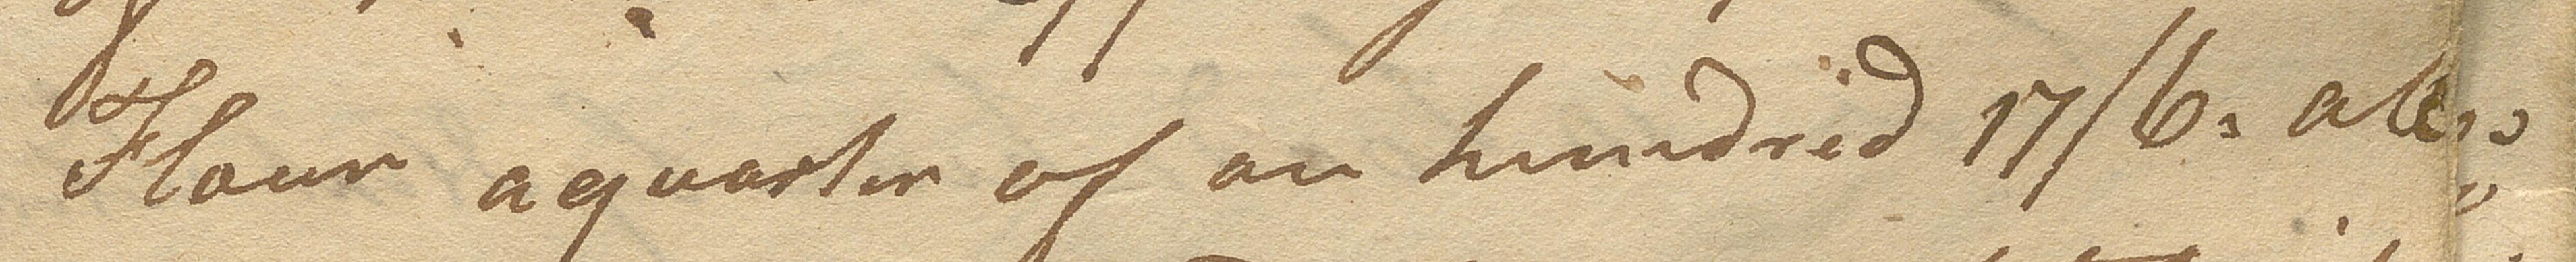Flour a quarter of an hundred 17s6. allso
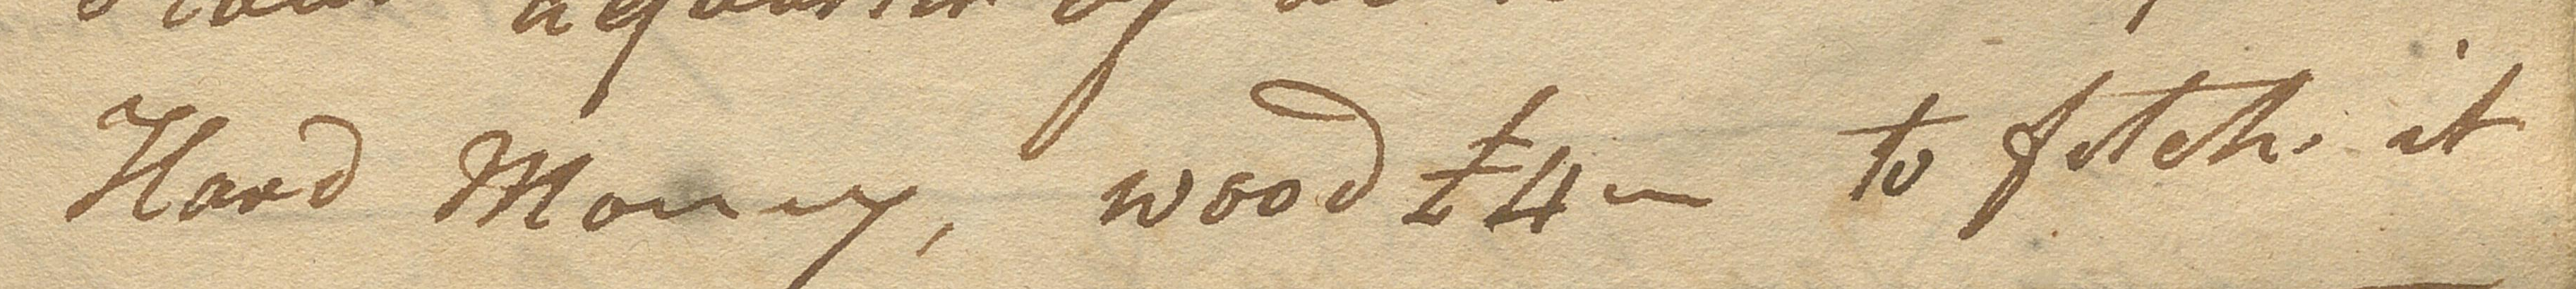Hard Money wood £4- to fetch it
